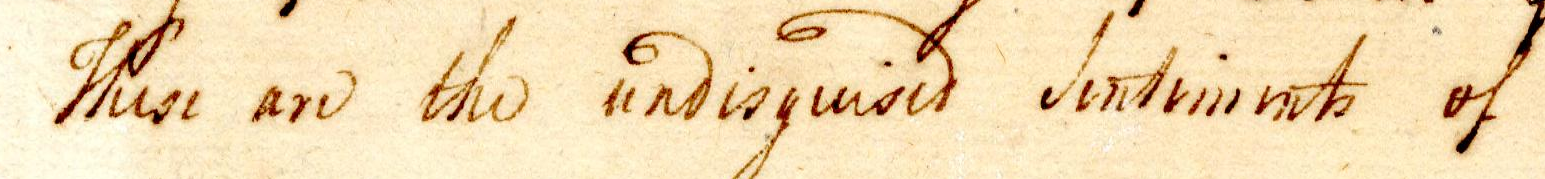These are the undisguised Sentiments of
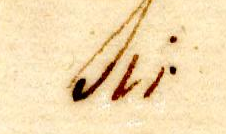Sir
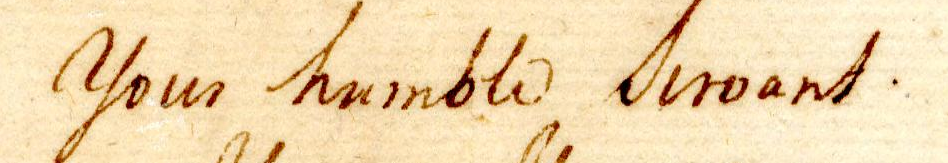Your humble Servant.
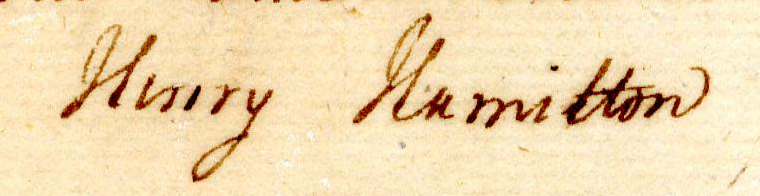Henry Hamilton
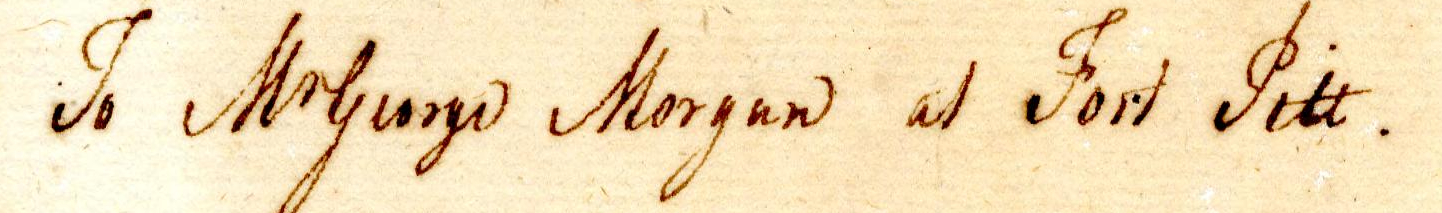To Mr George Morgan at Fort Pitt.
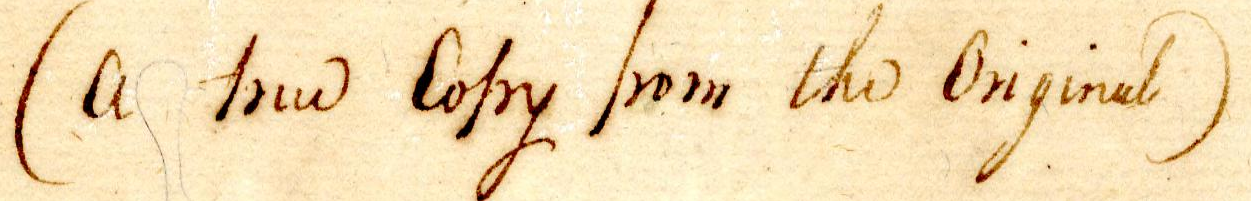(A true Copy from the Original)
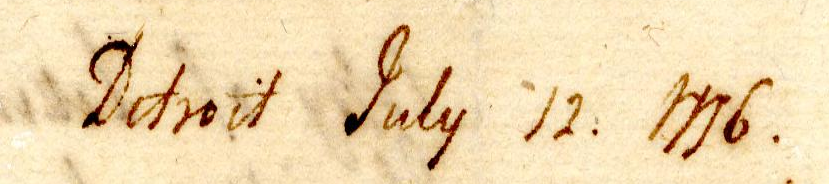Detroit July 12. 1776.
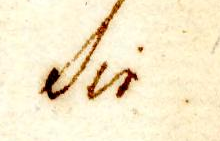Sir
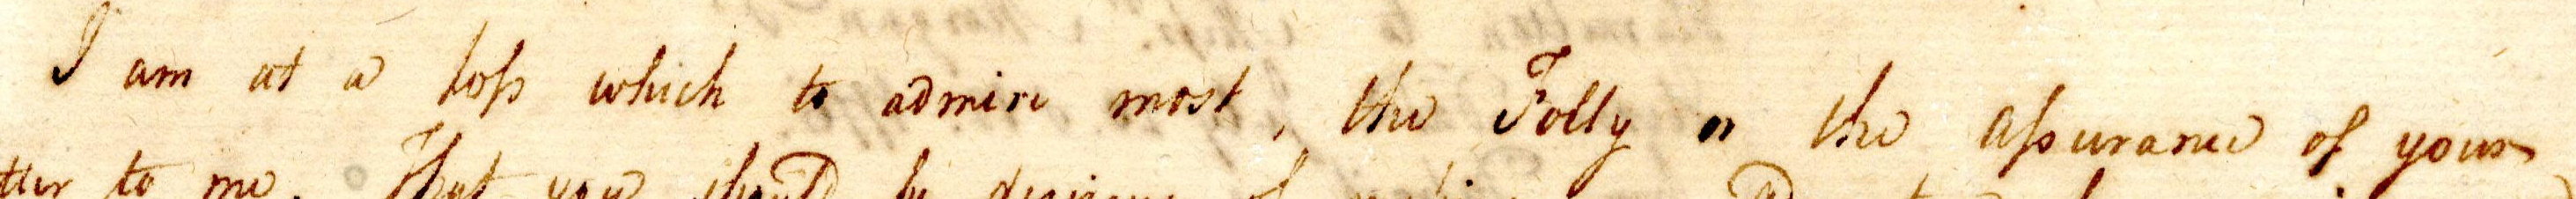I am at a loss which to admire most, the Folly or the assurance of your
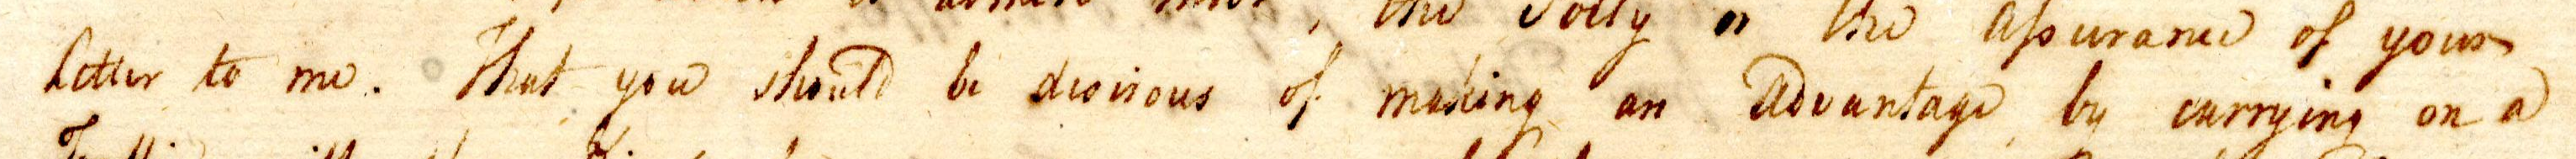Letter to me. That you should be desirous of making an advantage by carrying on a
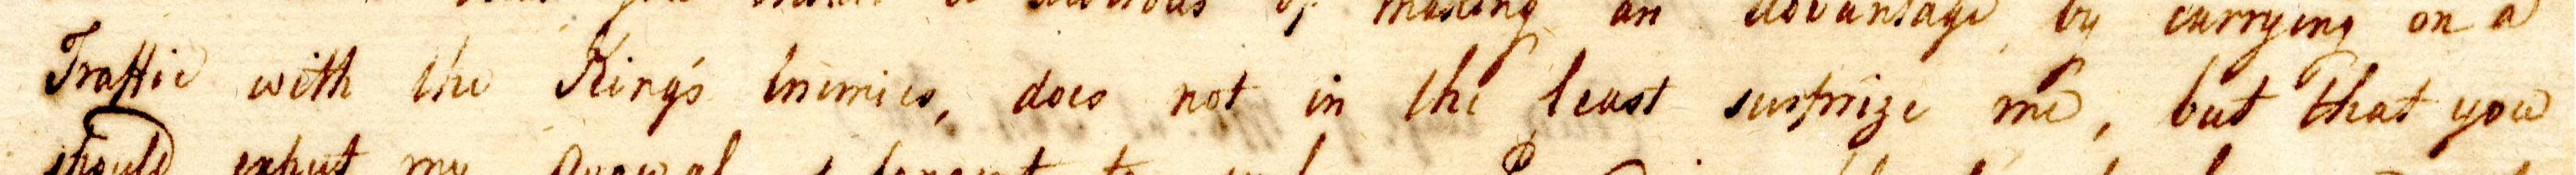Traffic with the King's Enemies, does not in the least surprize me, but that you
